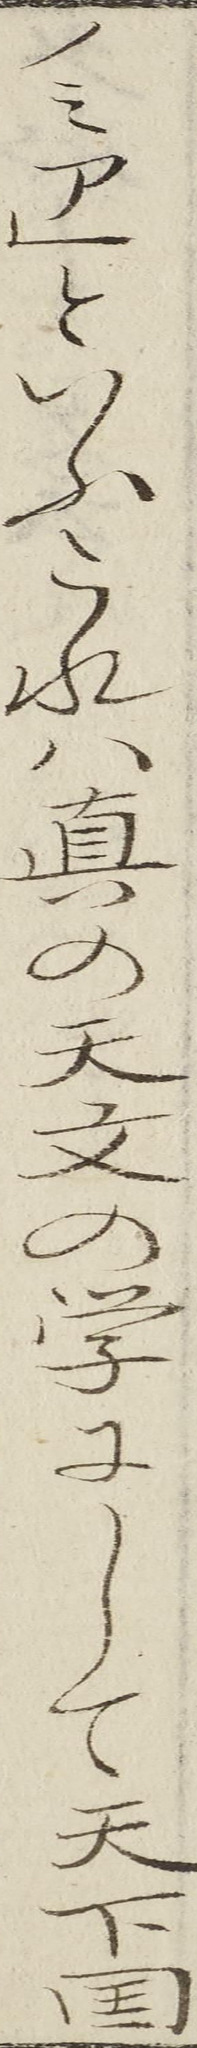ノミア」といふこれハ真の天文の学にして天下国
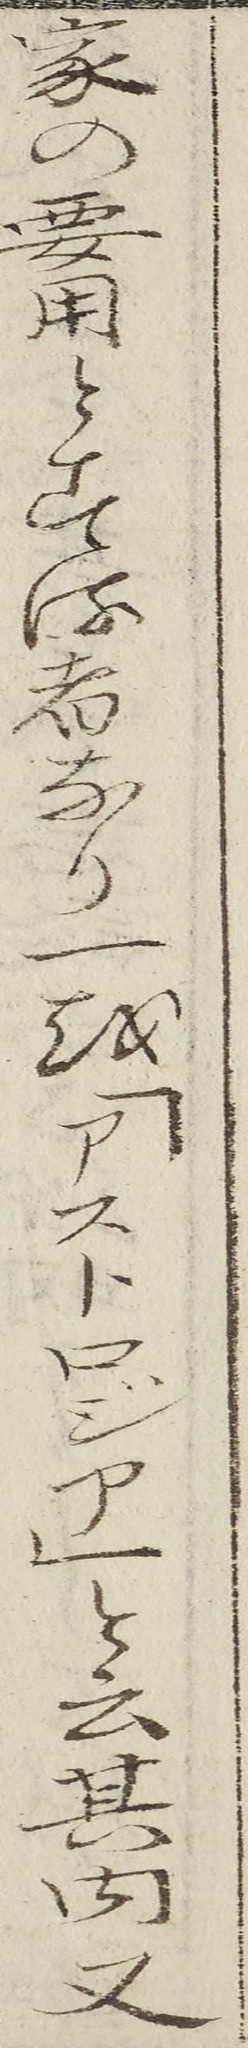家の要用とする者なり一を「アストロジア」と云其内又
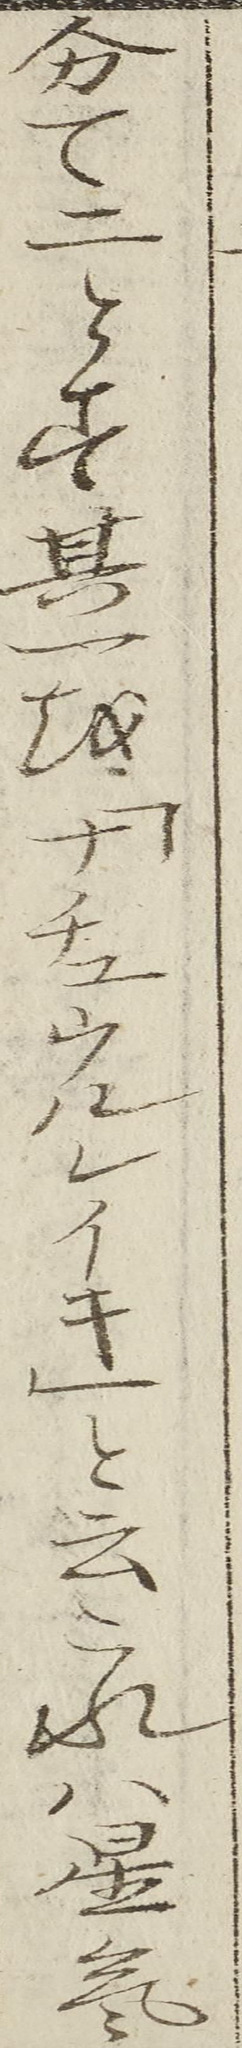分て二とす其一を「ナチュウルレイキ」と云これハ星気
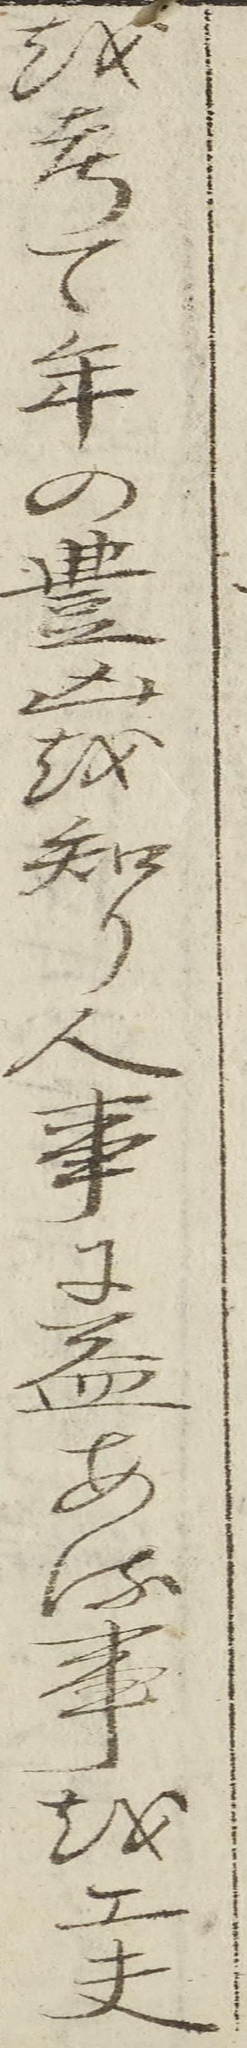を考て年の豊凶を知り人事に益ある事を工夫
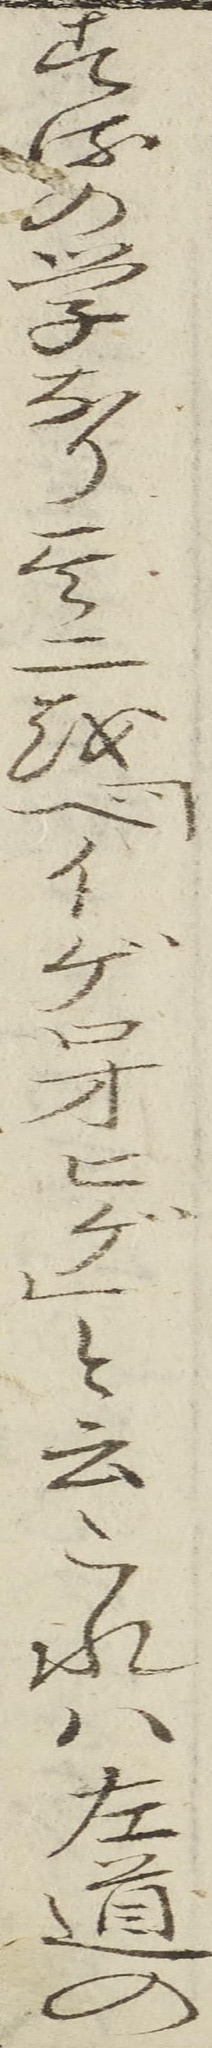するの学なり其二を「ベイゲロオヒゲ」と云これハ左道の

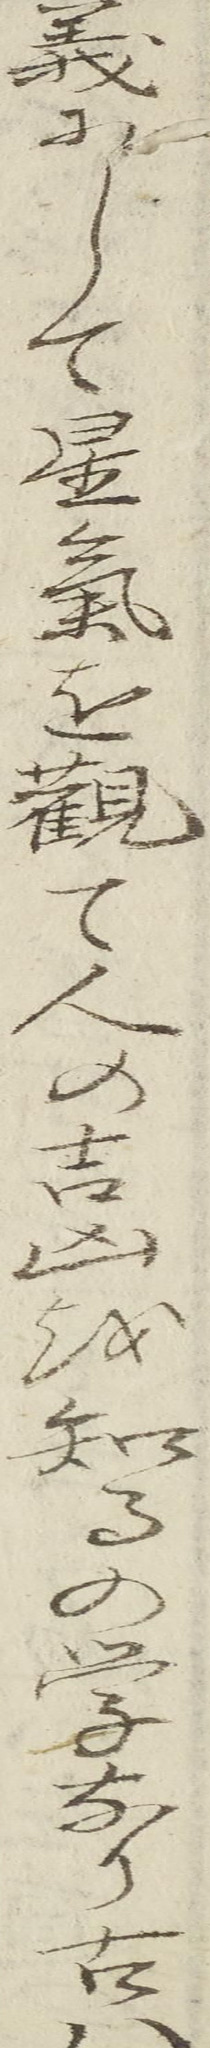義にして星気を観て人の吉凶を知るの学なり古ハ
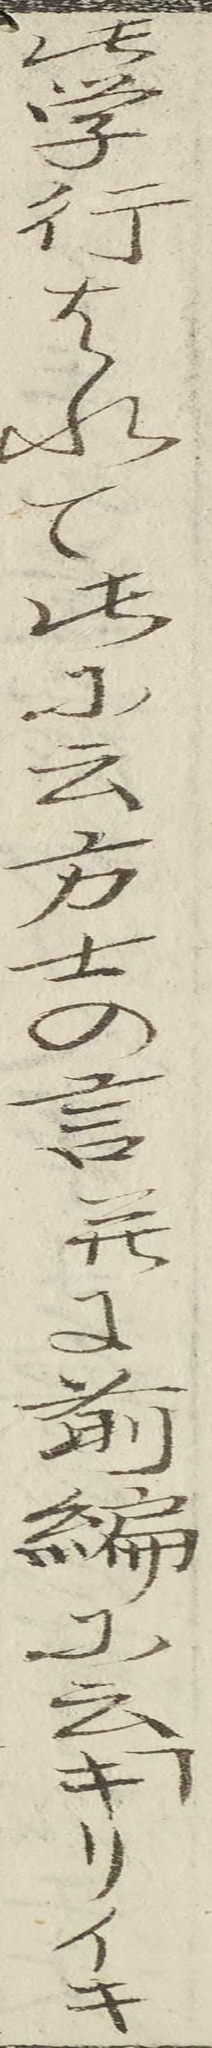此学行はれて此に云方士の言并前編に云「キリイキ
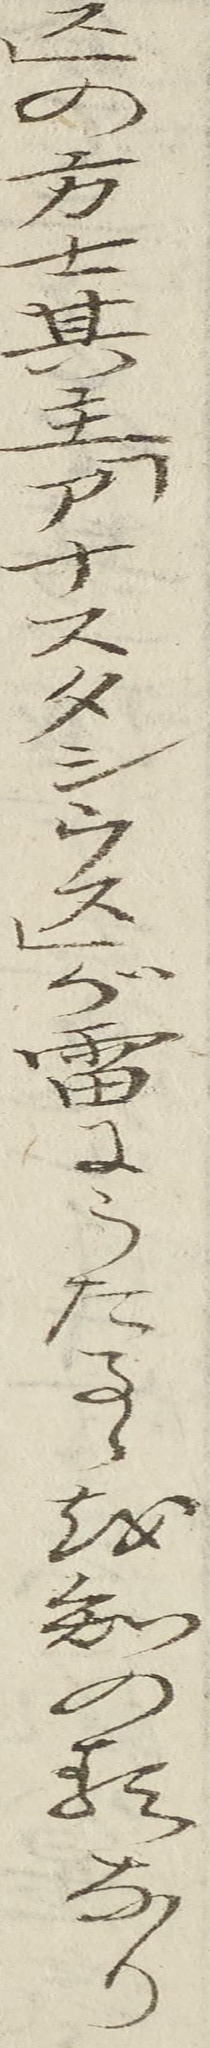ス」の方士其主「アナスタシウス」が雷にうたるゝを知の類なり
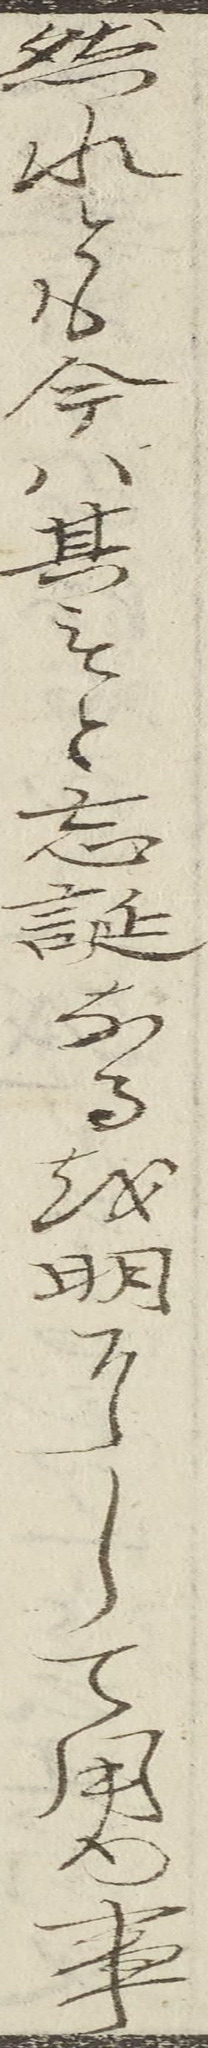然れとも今ハ其もと忘誕なるを明にして用ゆ事
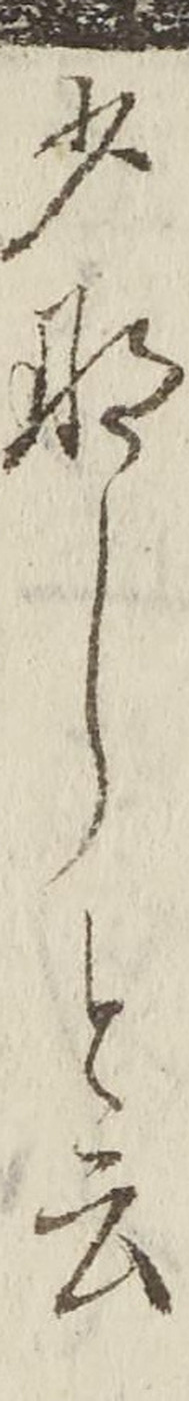少なしと云
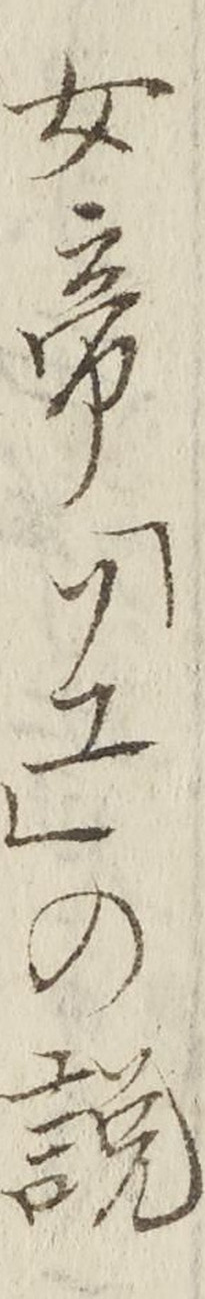女帝「ソユ」の説
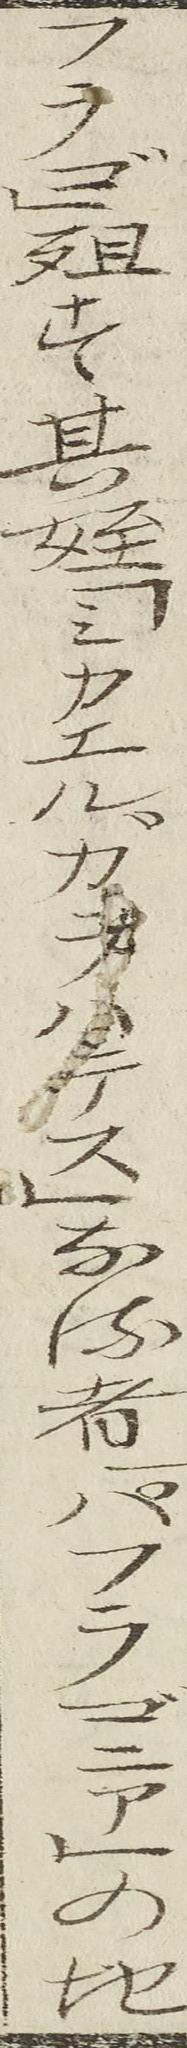「フナゴ」殂す其姪「シカエル。カラハテス」なる者「パフラゴ二ア」の地
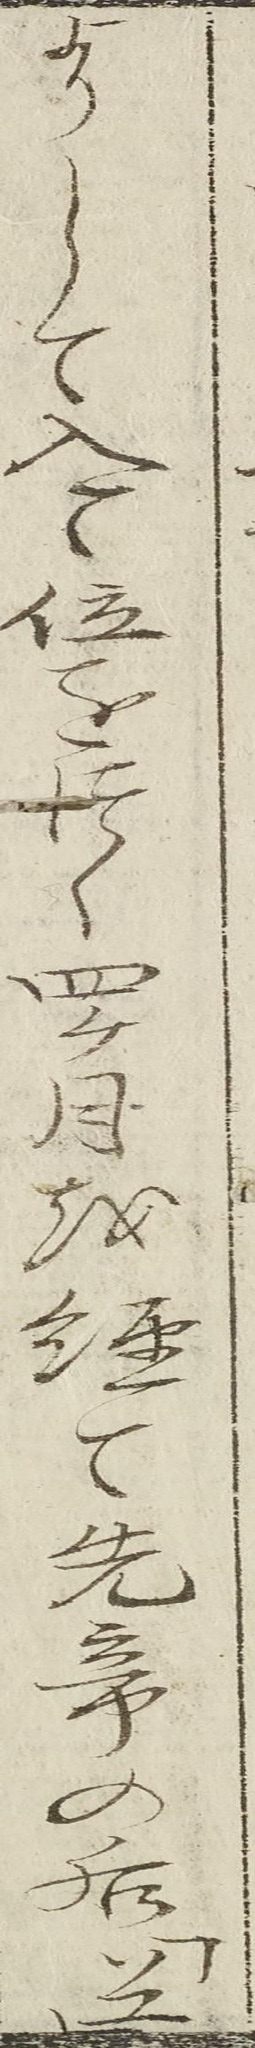よりして入て位をつく四ヶ月を経て先帝の后「ソユ」
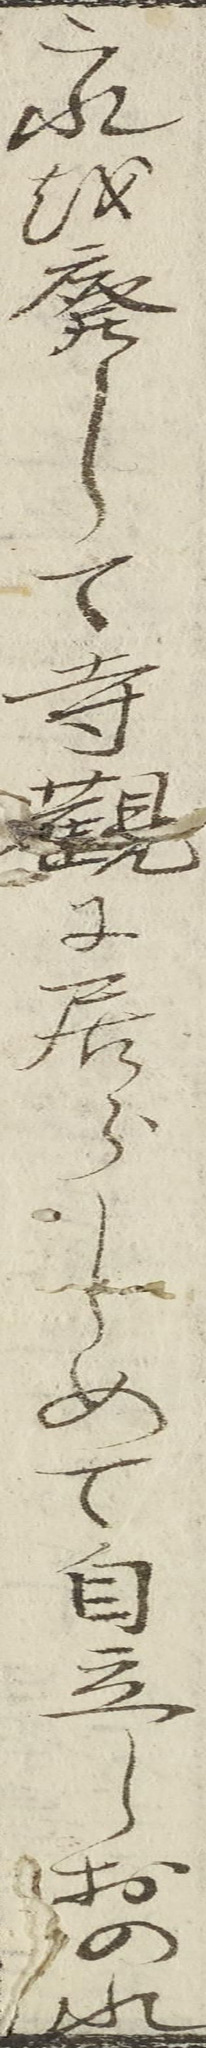これを廃して寺観に居らしめて自立しおのれ
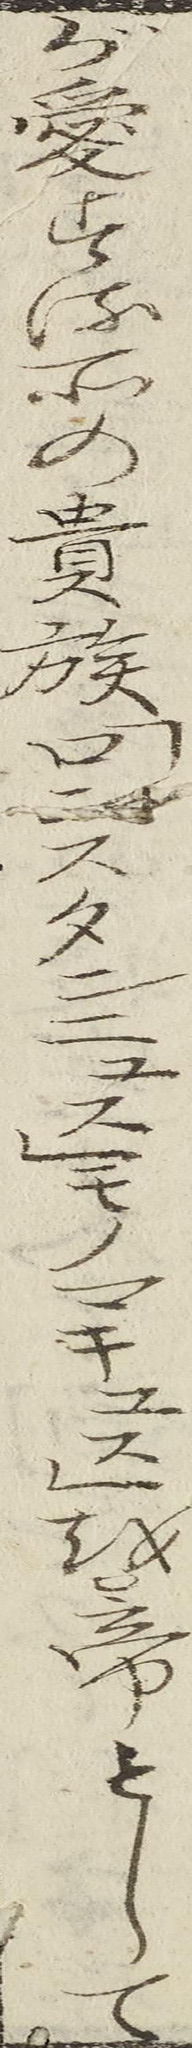が愛す所の貴族「ロニスタン二ュス」モノマキュス」を帝として
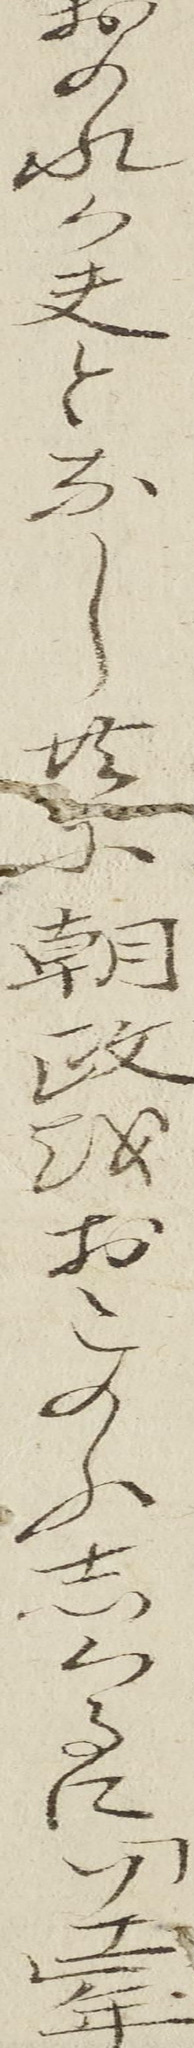おのれか夫となし共に朝政をおこのふしかるに「ソユ」年
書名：西洋雜記　乾
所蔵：東京大学地震研究所図書室 Earthquake Research Institute Library, The University of Tokyo, JAPAN
